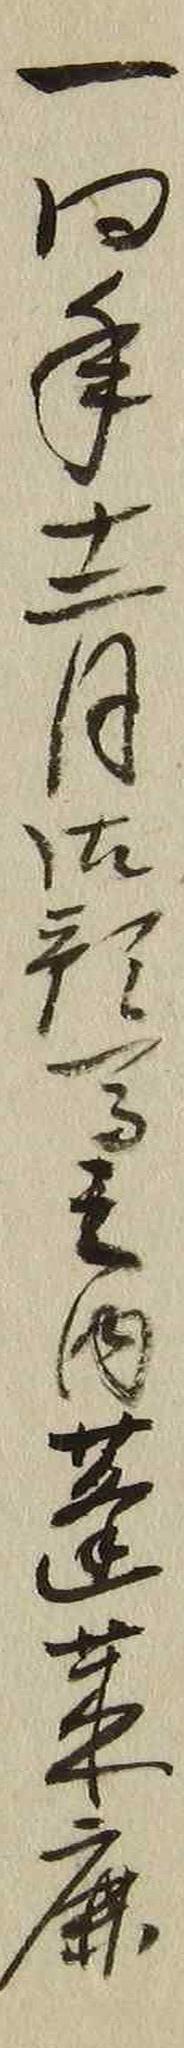一同年十二月御預馬之内蓬莱鹿
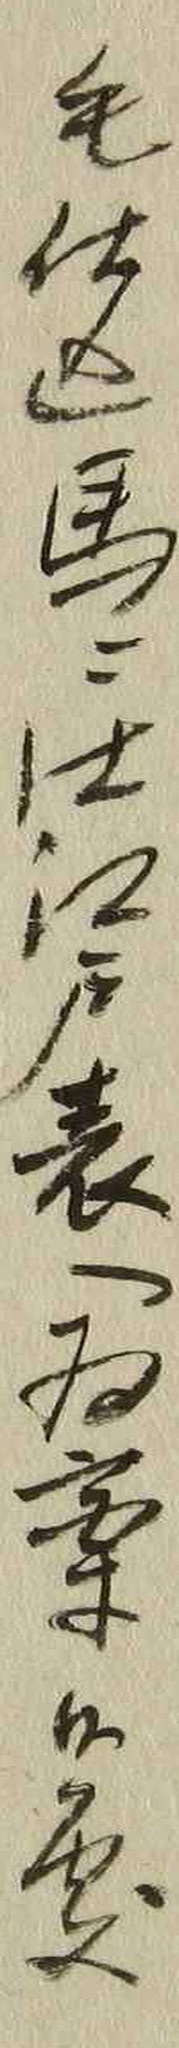毛仕込馬ニ仕江戸表へ為牽候処
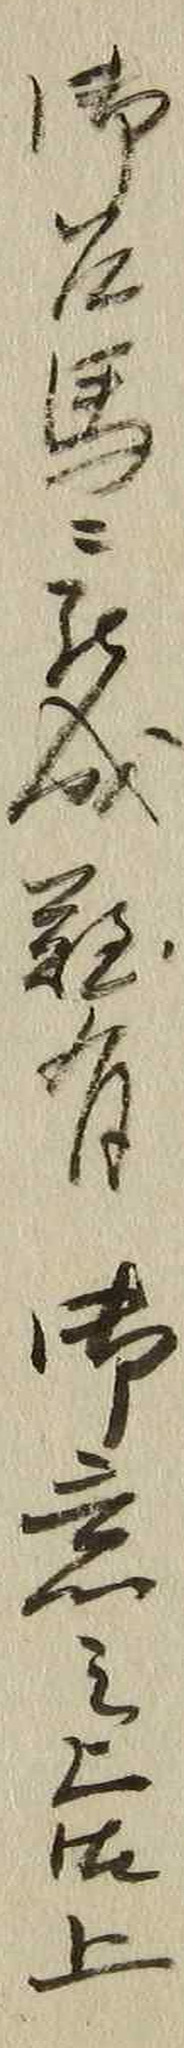御召馬ニ罷成難有御意之上御上
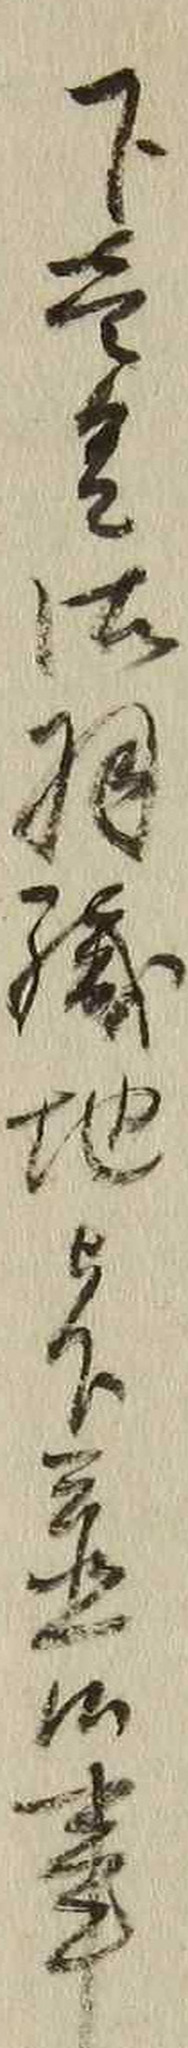下壱具御羽織地被下置候事
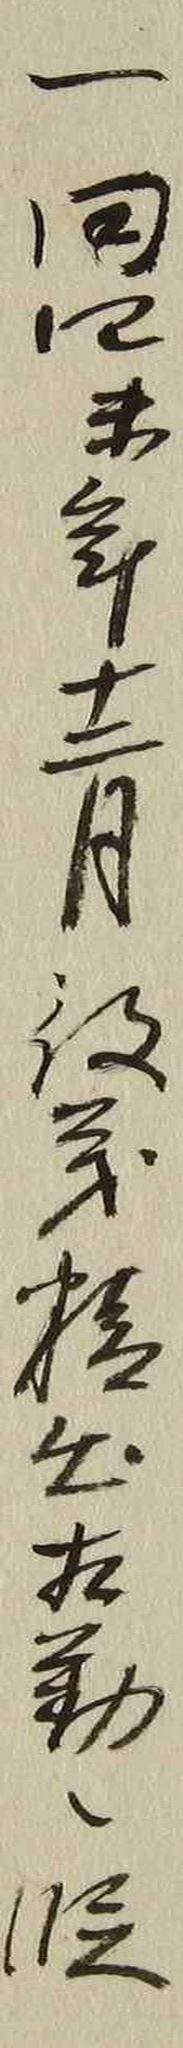一同四未年十二月役義精出相勤候段
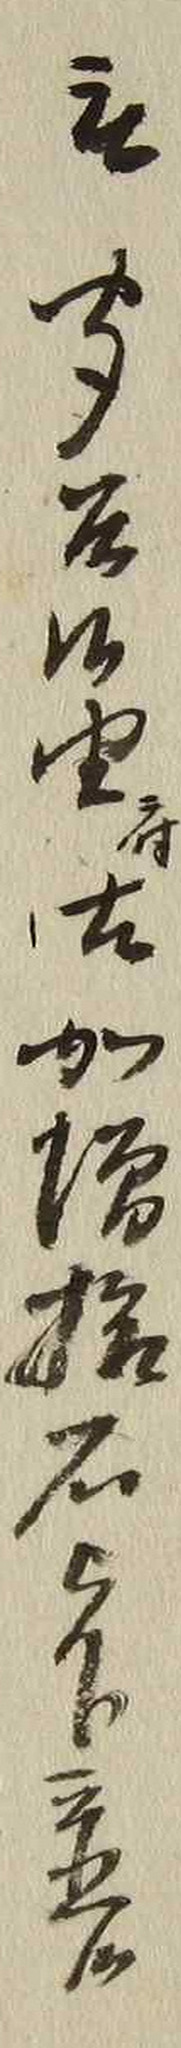被聞召候由ニ付御加増拾石被下置候
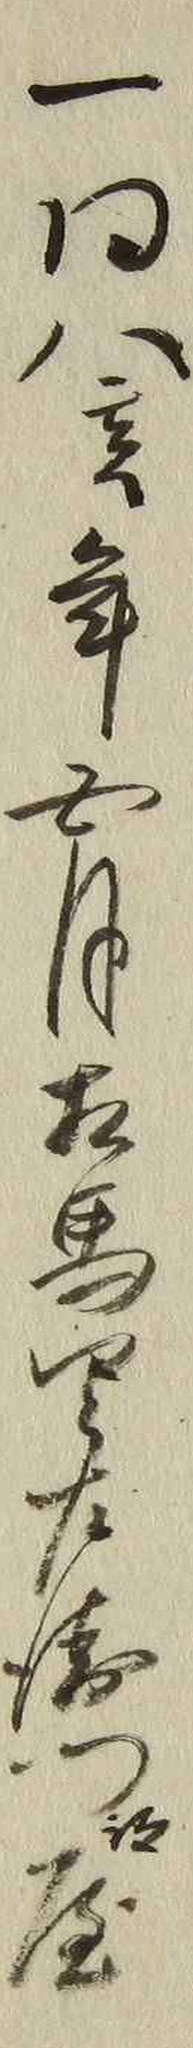一同八亥年五月相馬四郎左衛門跡屋
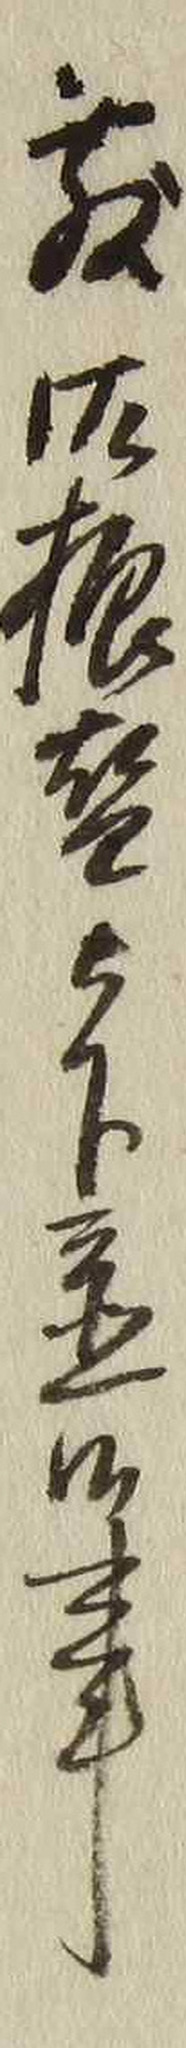敷御振替被下置候事
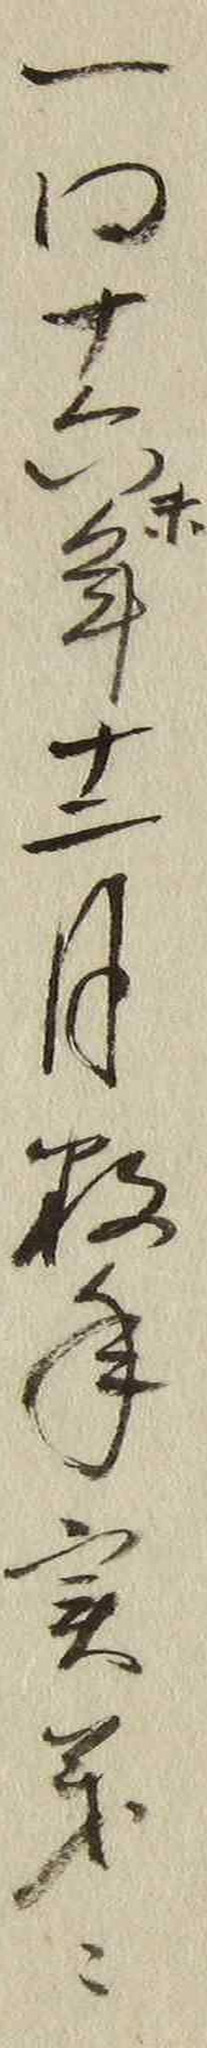一同十六未年十二月数年実義ニ
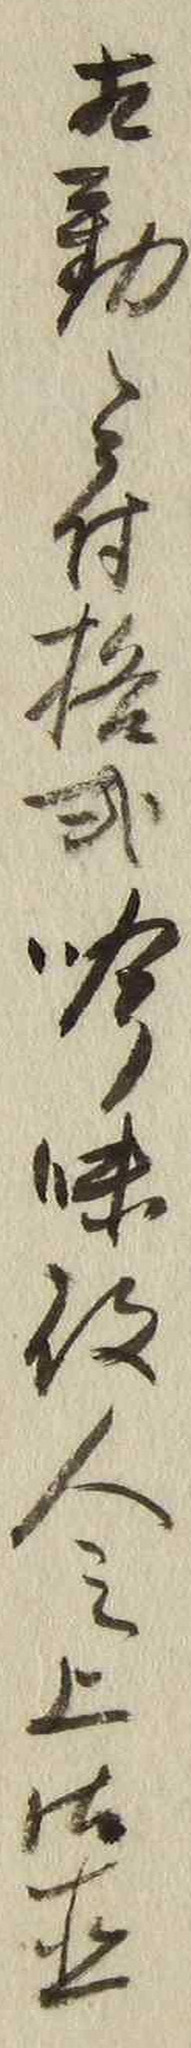相勤候ニ付格式吟味役人之上御直
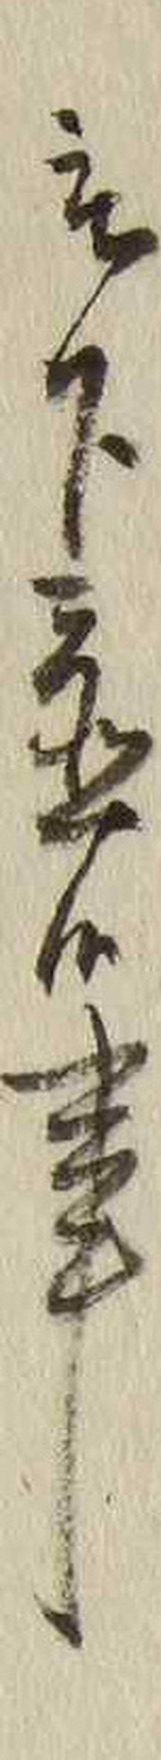被下置候事
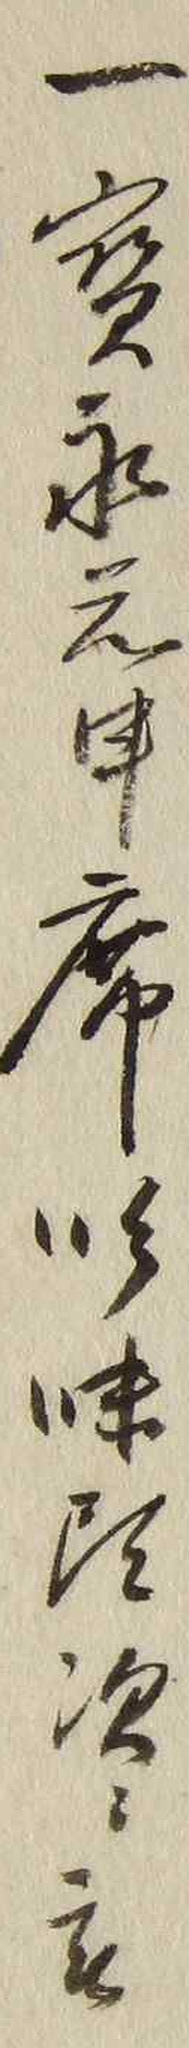一宝永元申席吟味頭次ニ被
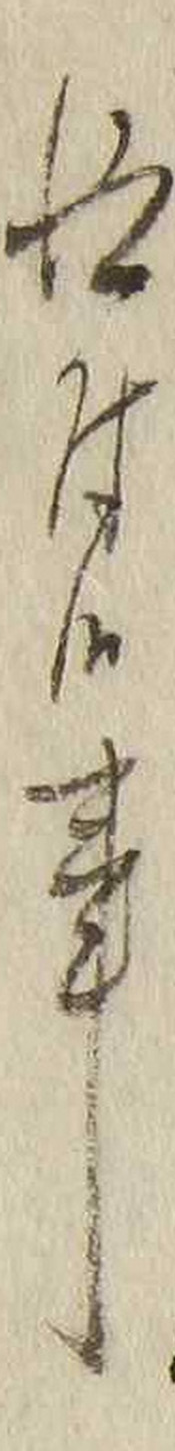仰付候事

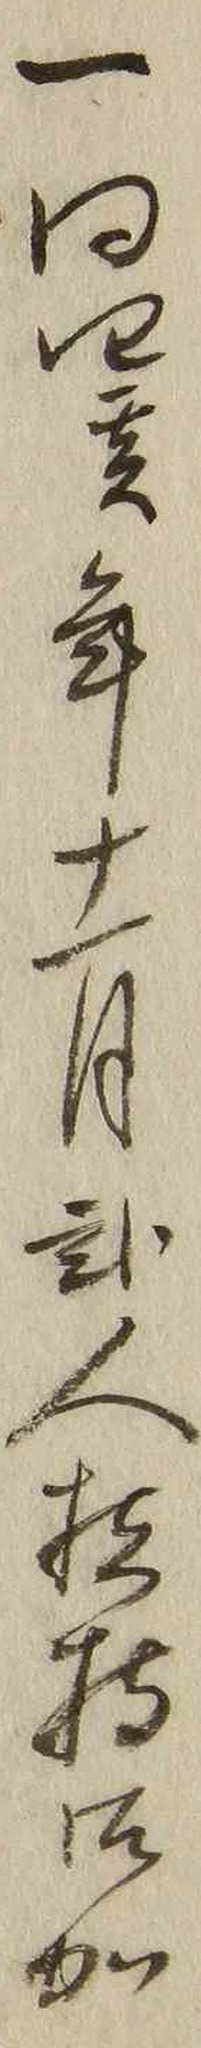一同四亥年十一月弐人扶持御加
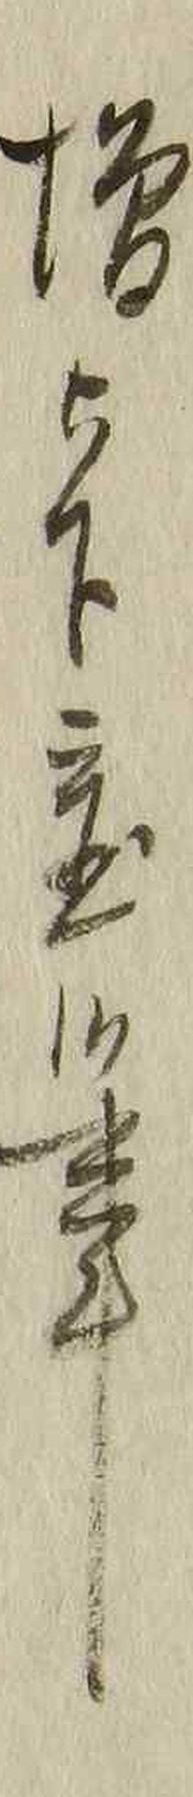増被下置候事
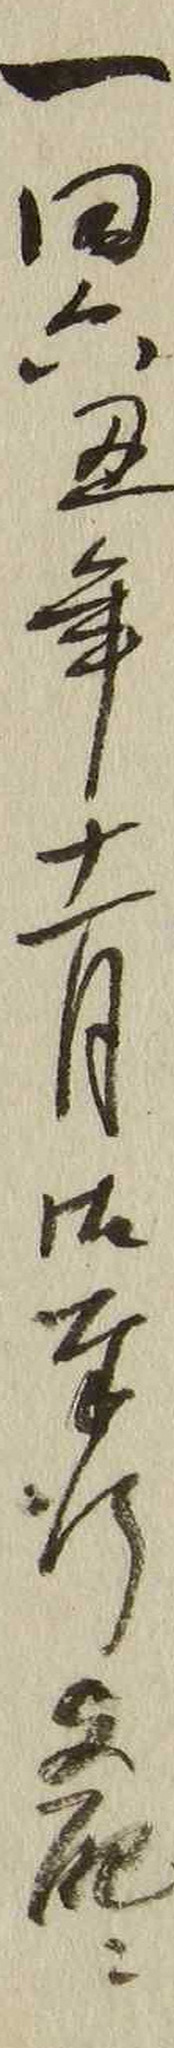一同六丑年十一月御奉行支配ニ
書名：諸士系譜　巻之359　す之部9
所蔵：会津若松市立会津図書館
